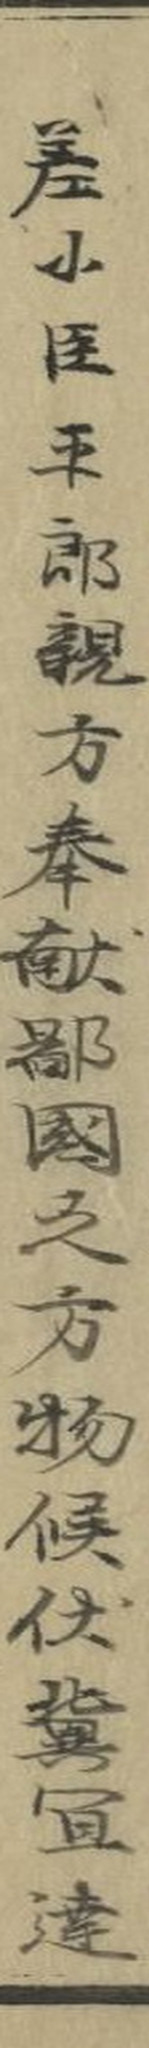差小臣平郎親方奉献鄙国之方物候伏冀冝達
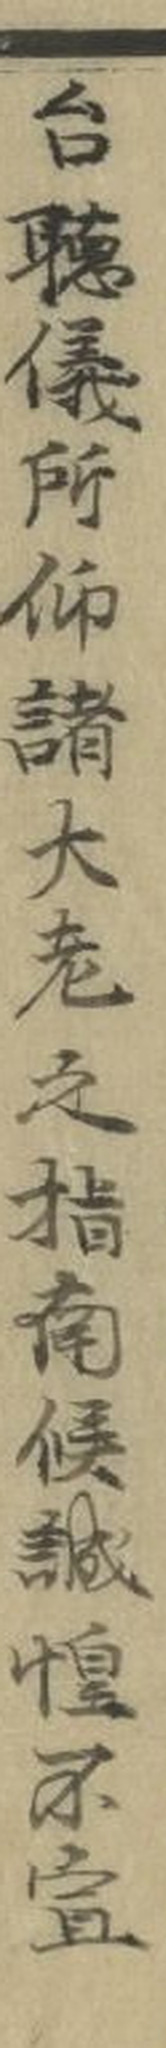台聴儀所抑諸大老之指南候誠惶不宣
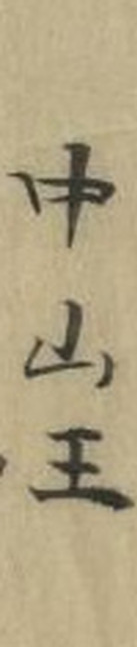中山王
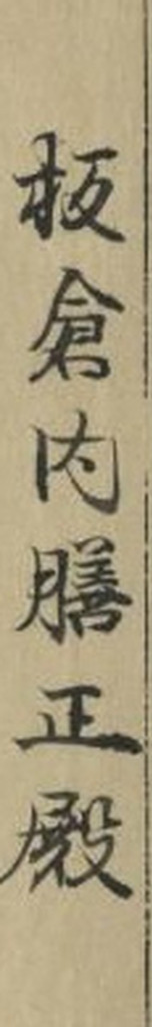板倉内膳正殿
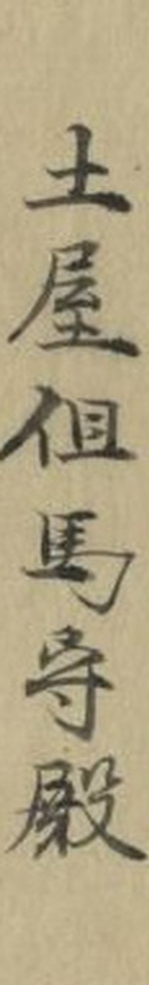土屋但馬守殿
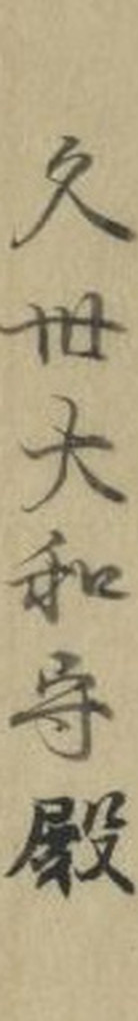久世大和守殿
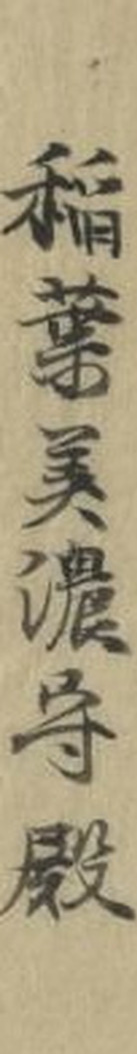稲葉美濃守殿
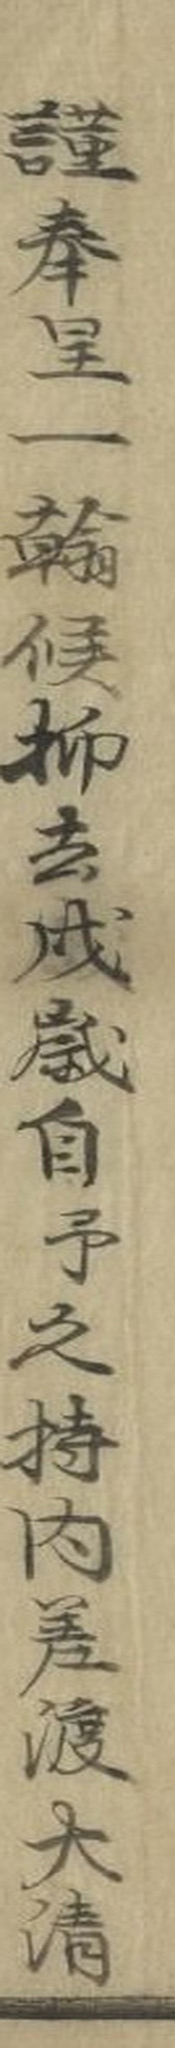謹奉呈一翰候抑去戌歳自予之持内差渡大清
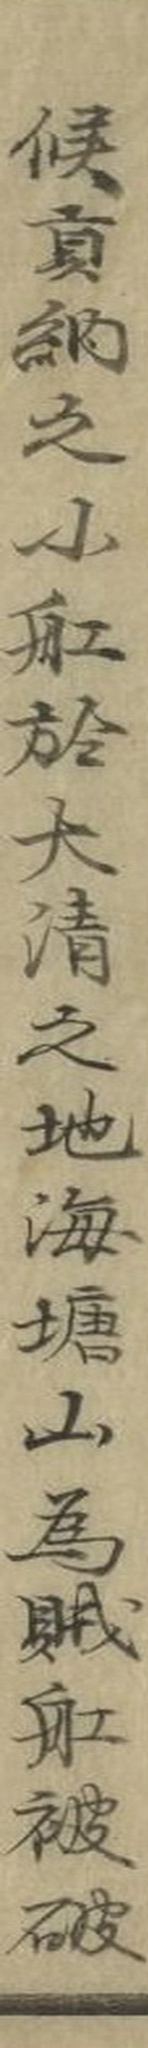候貢納之小舩於大清之地海塘山為賊舩被破
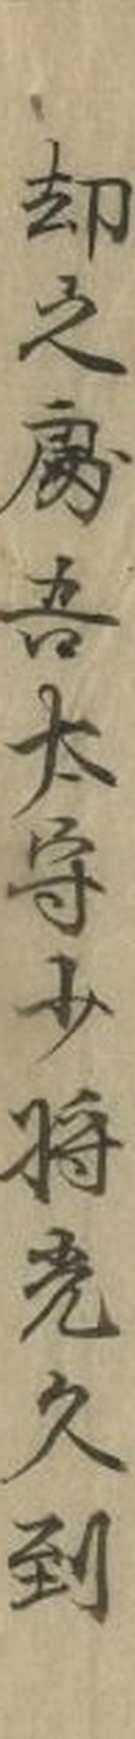却之処吾太守少将光久到
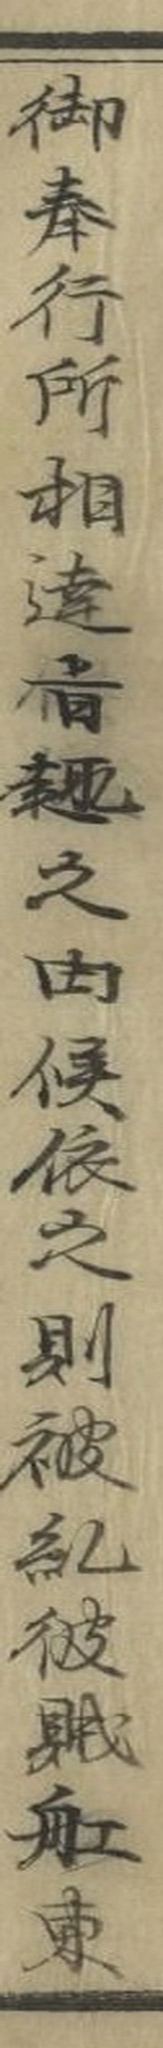御奉行所相達旨趣之由候依之則被糺彼賊舩東
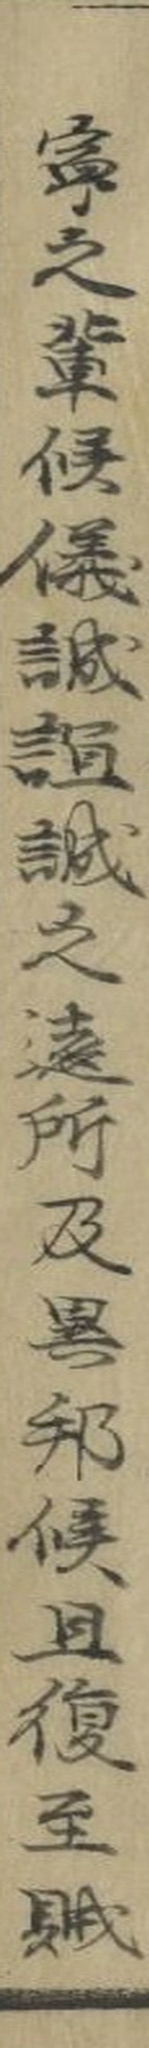寧之輩候儀誠誼誠之遠所及異邦候且復至賊

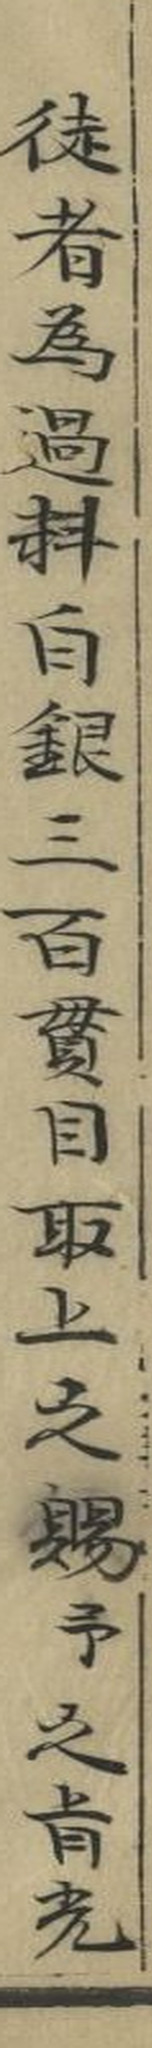従者為過料白銀三百貫目取上之賜予之旨光
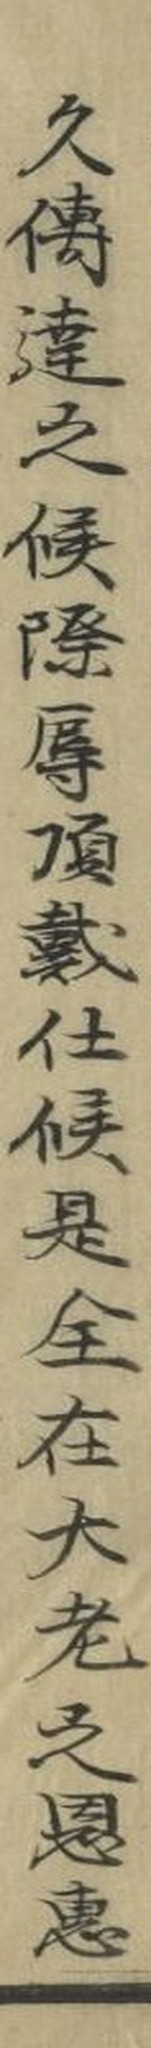久伝達之候際辱頂戴仕候是全在大老之恩恵
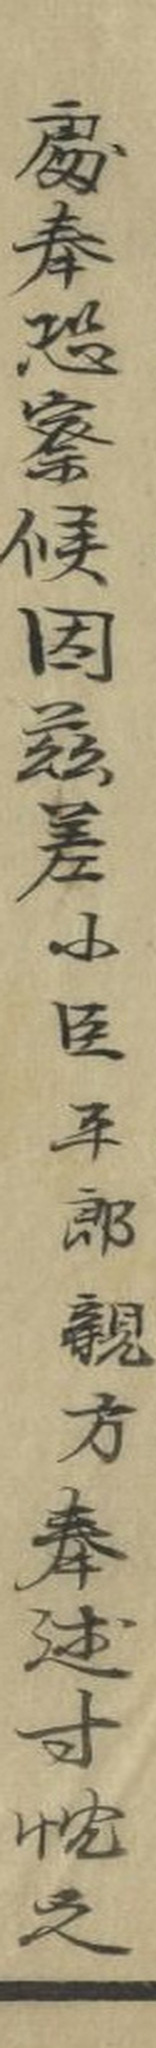處奉恐察候因茲差小臣平郎親方奉述寸忱之
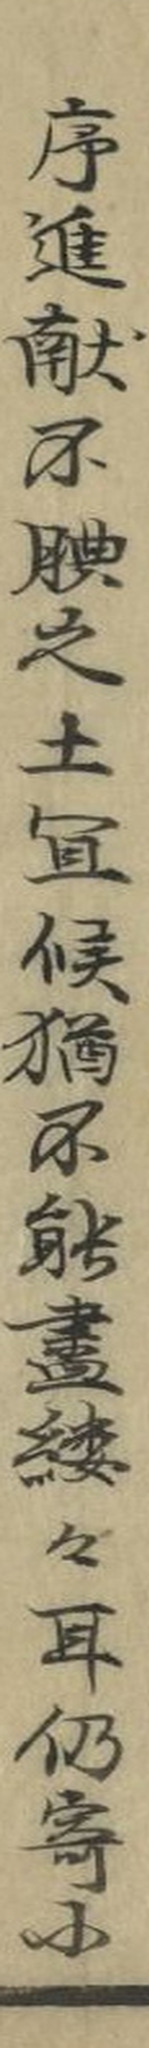序進献不腆之土冝候猶不能尽縷々耳仍寄小
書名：琉球往来（下）
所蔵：University of the Ryukyus Library
